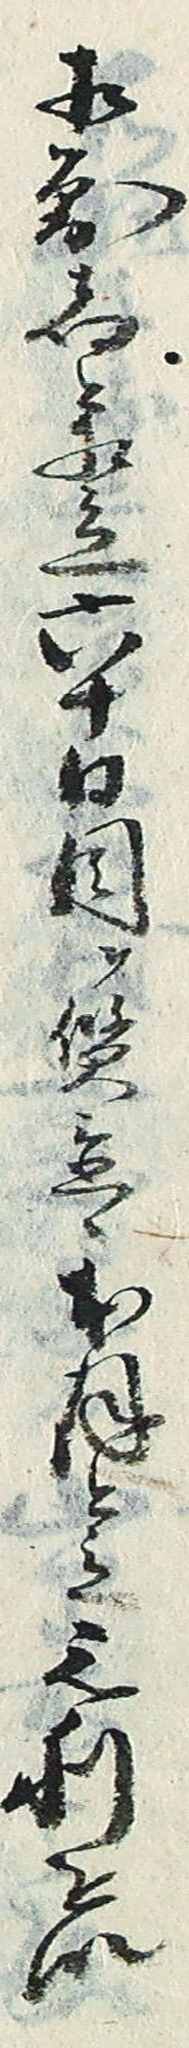相創者と相立六十日目ヲ質置候本月と立元利を以
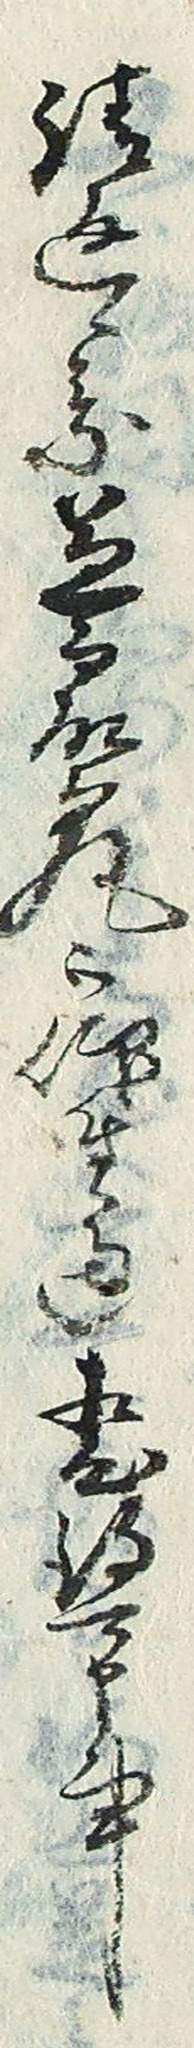請返候義兼而取究被仰付候通相心得可申事
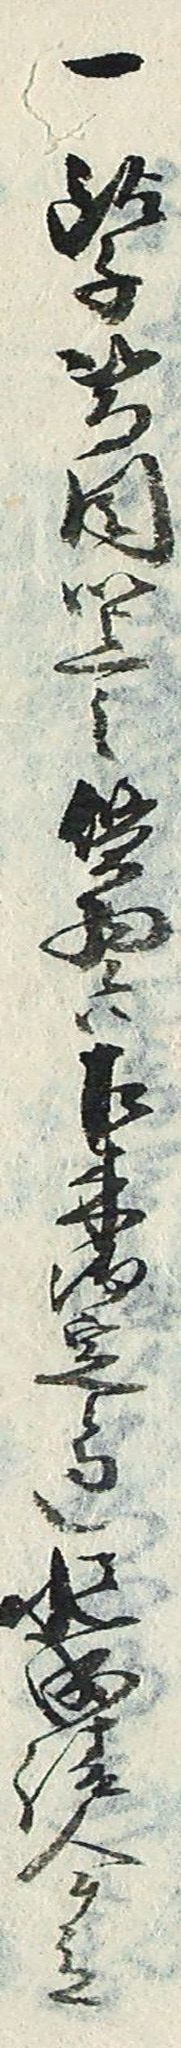一銀子弐百目以上之質物候ハ古来約定之通慥成請人ヲ立
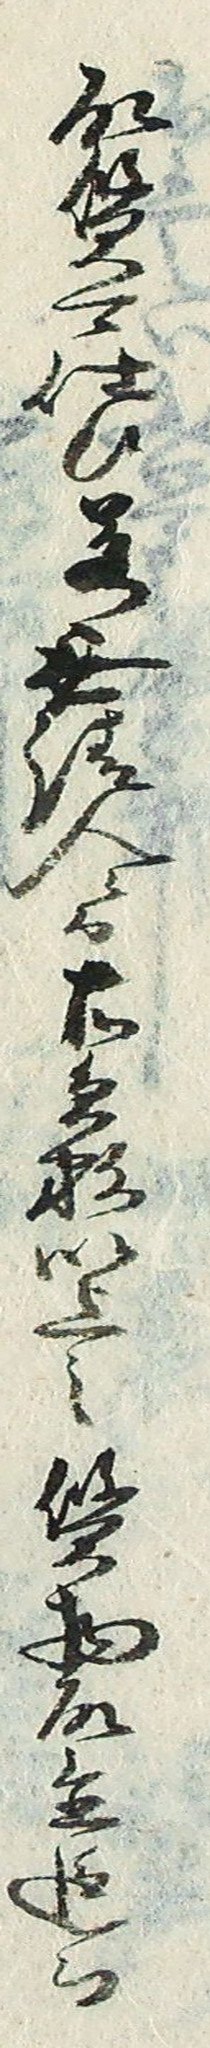取質可仕候若無請人ニ而右員数以上之質物取置追而
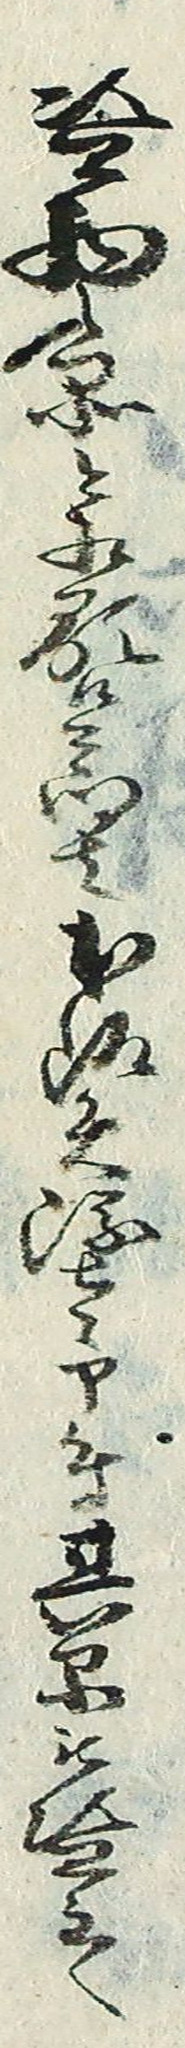盗物之品と相顕候節者本銀失墜ニ申付其品被盗主へ
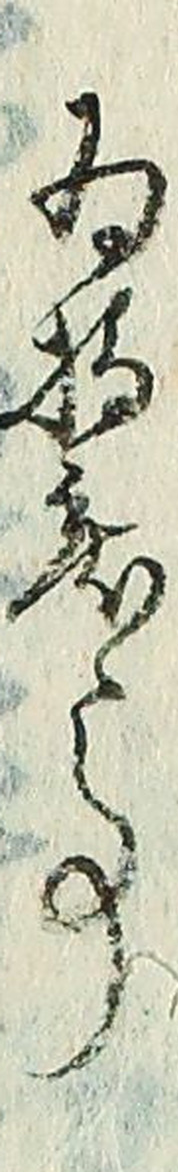為指戻候事
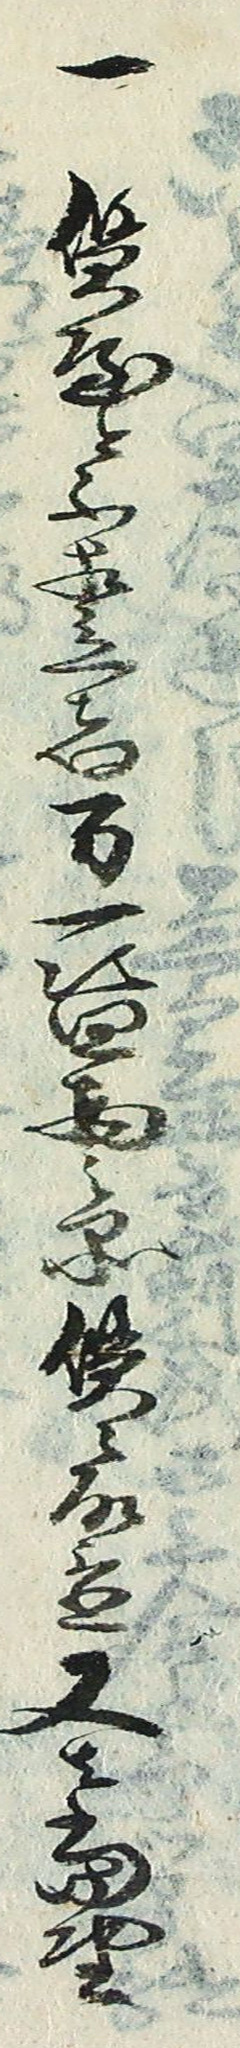一質屋と不相立者万一盗物之品質ニ取置又者當坐
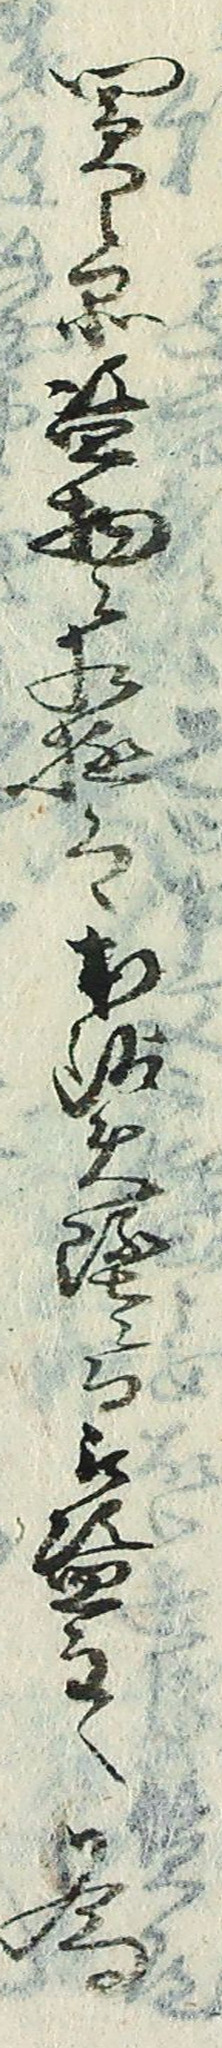買之品盗物ニ相極候ハヽ本銀失墜ニ而被盗主へ被為
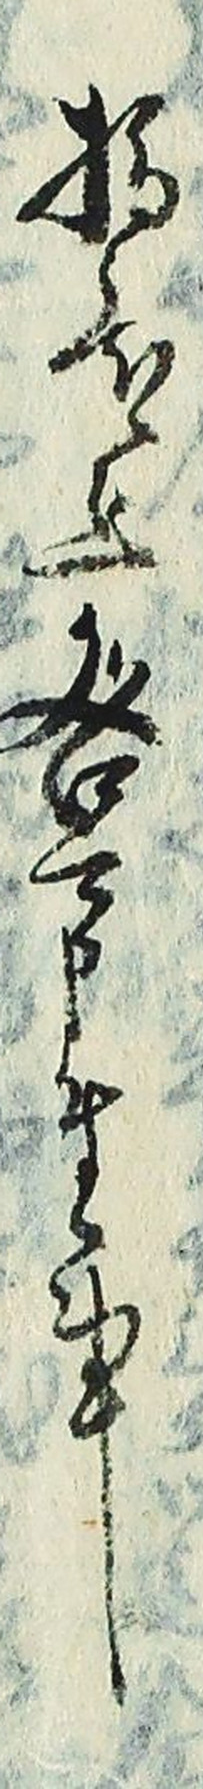指戻候上咎可申付候事
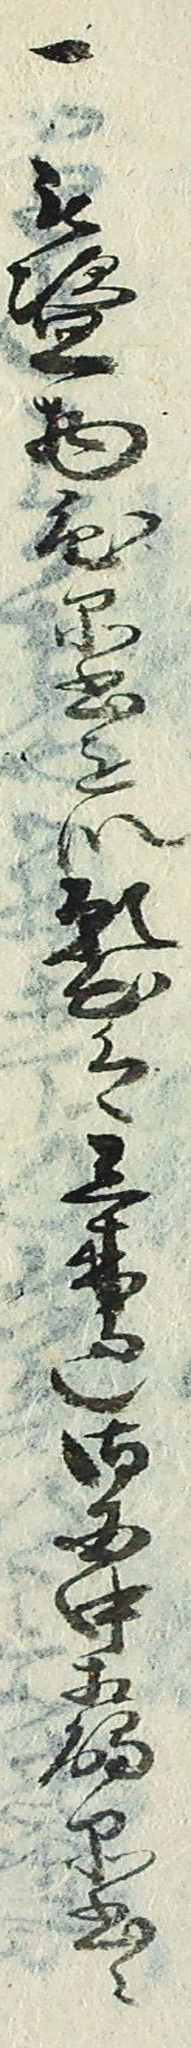一被盗物色品書を以願出候ハヽ己来通御国中相觸品書ニ
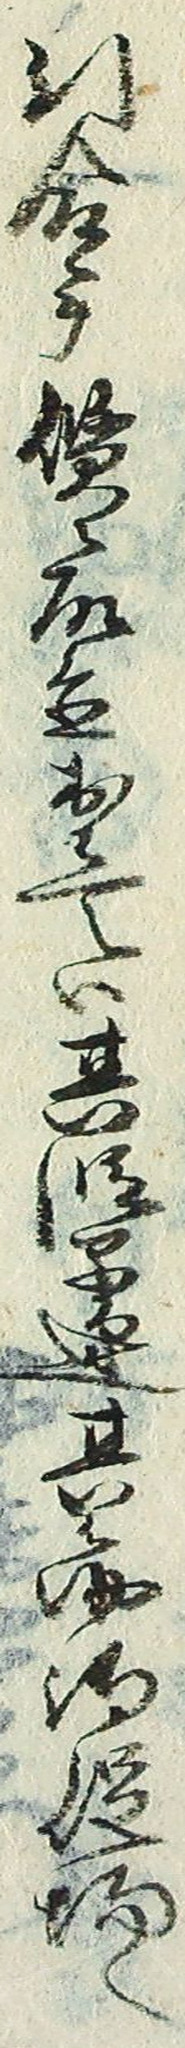引合候テ質ニ取置於有之候ハ其段早速其筋御役場へ
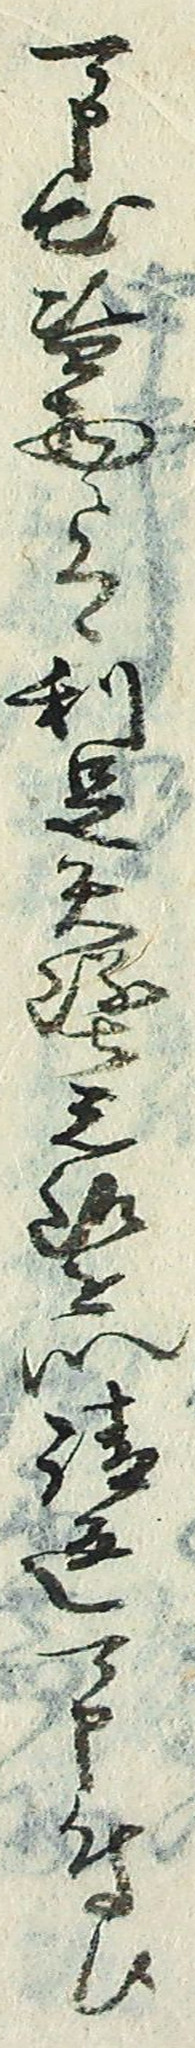可申出盗物ニ候ハヽ利息失墜元銀を以請返可申付候
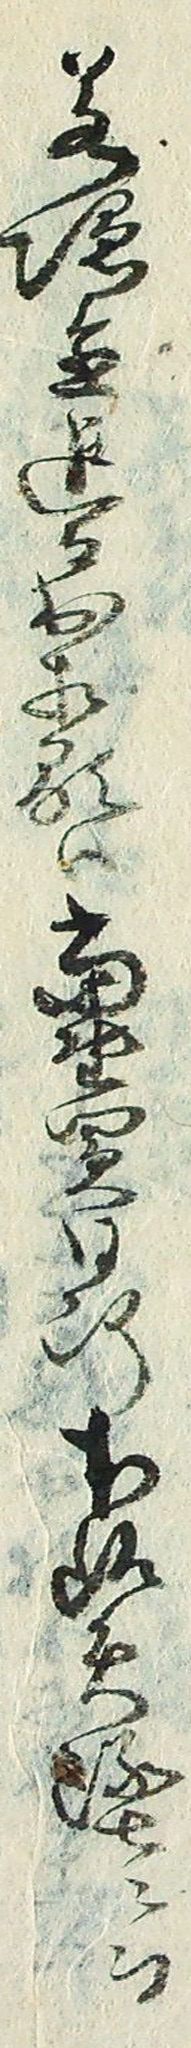若隠置追而於相顕ハ當坐買同断本銀失墜ニ而
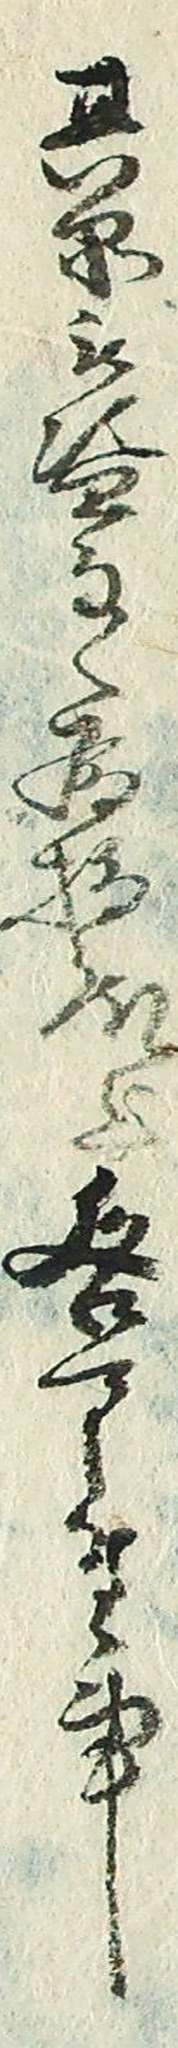其品被盗主へ為指戻候上咎可申付候事
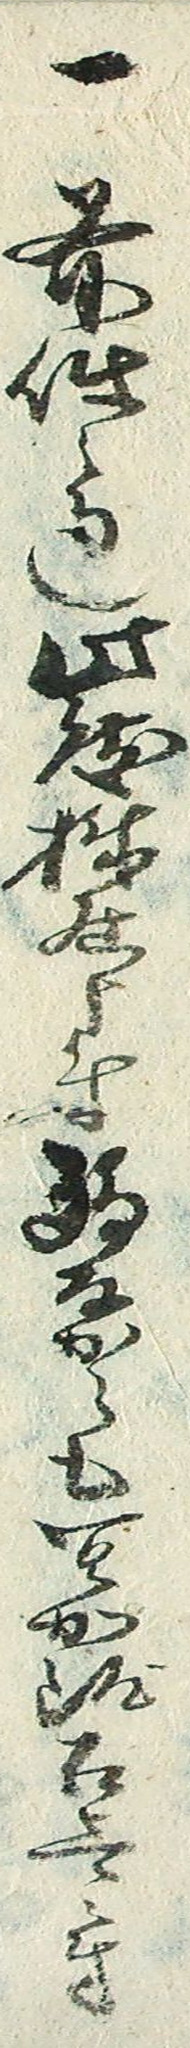一前件之通此度株居申付錙なからも冥加銀召上候ニ付
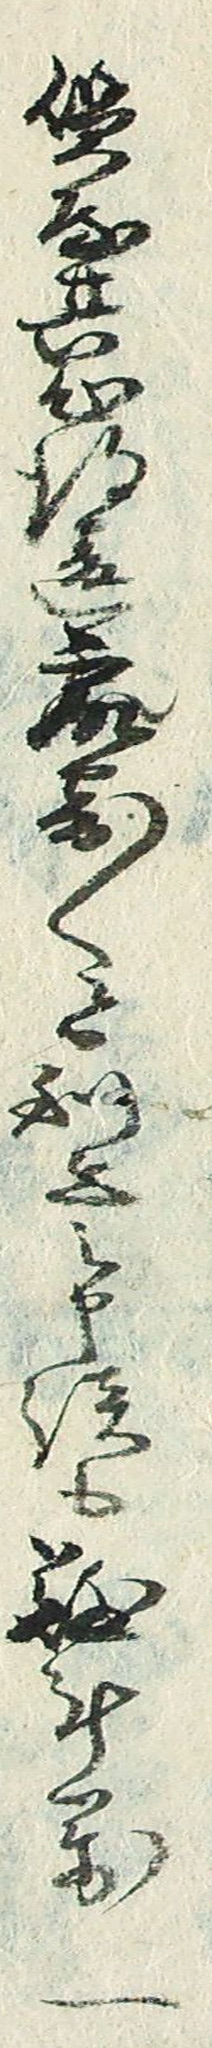質屋共心得違衆寄〳〵ニ而利上之申談も難計萬一
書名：市郷質屋株御取究並御書出御趣法之写
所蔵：鳴門教育大学 Naruto University of Education
